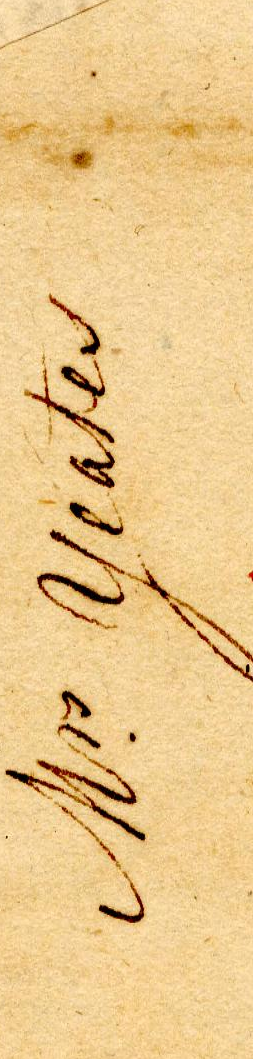M^rs. Yeates
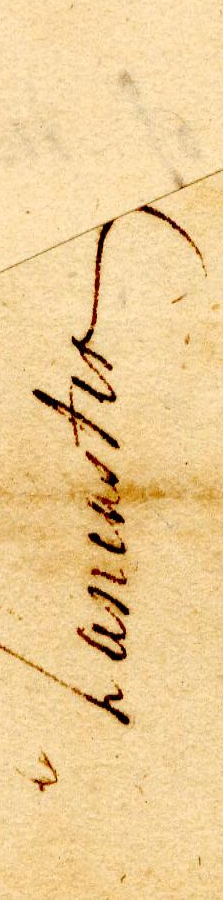Lancaster
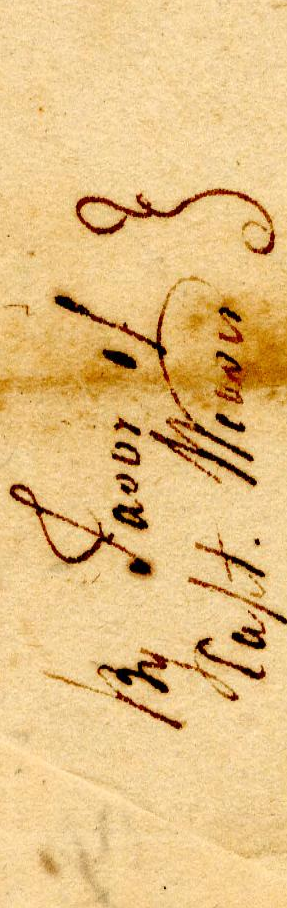By Favor of
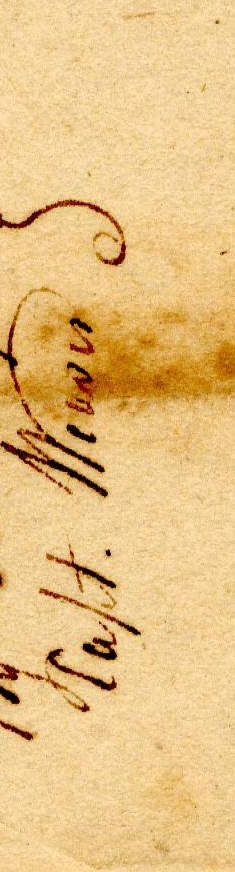Capt. Weaver
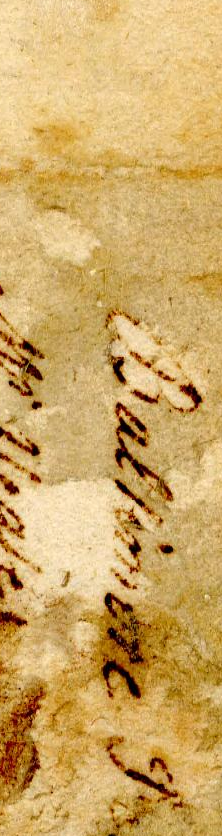Baltimore
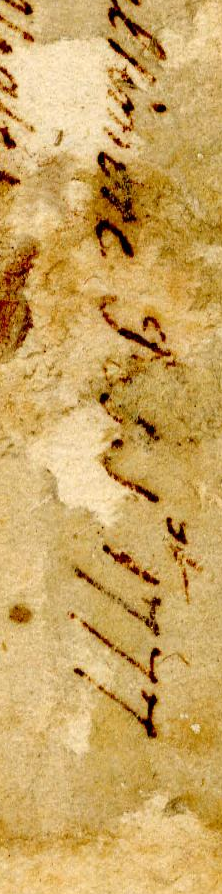Jan. 30^th 1777
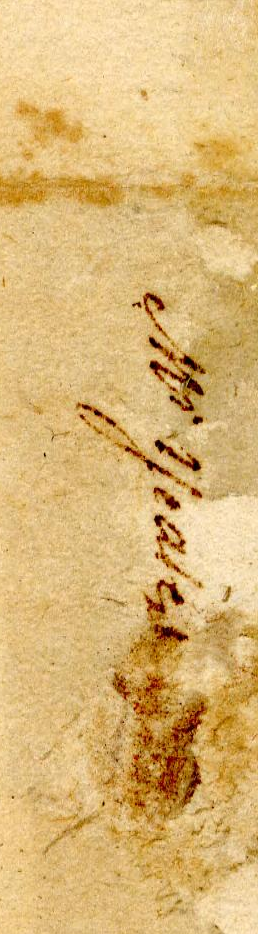M^r. Yeates
